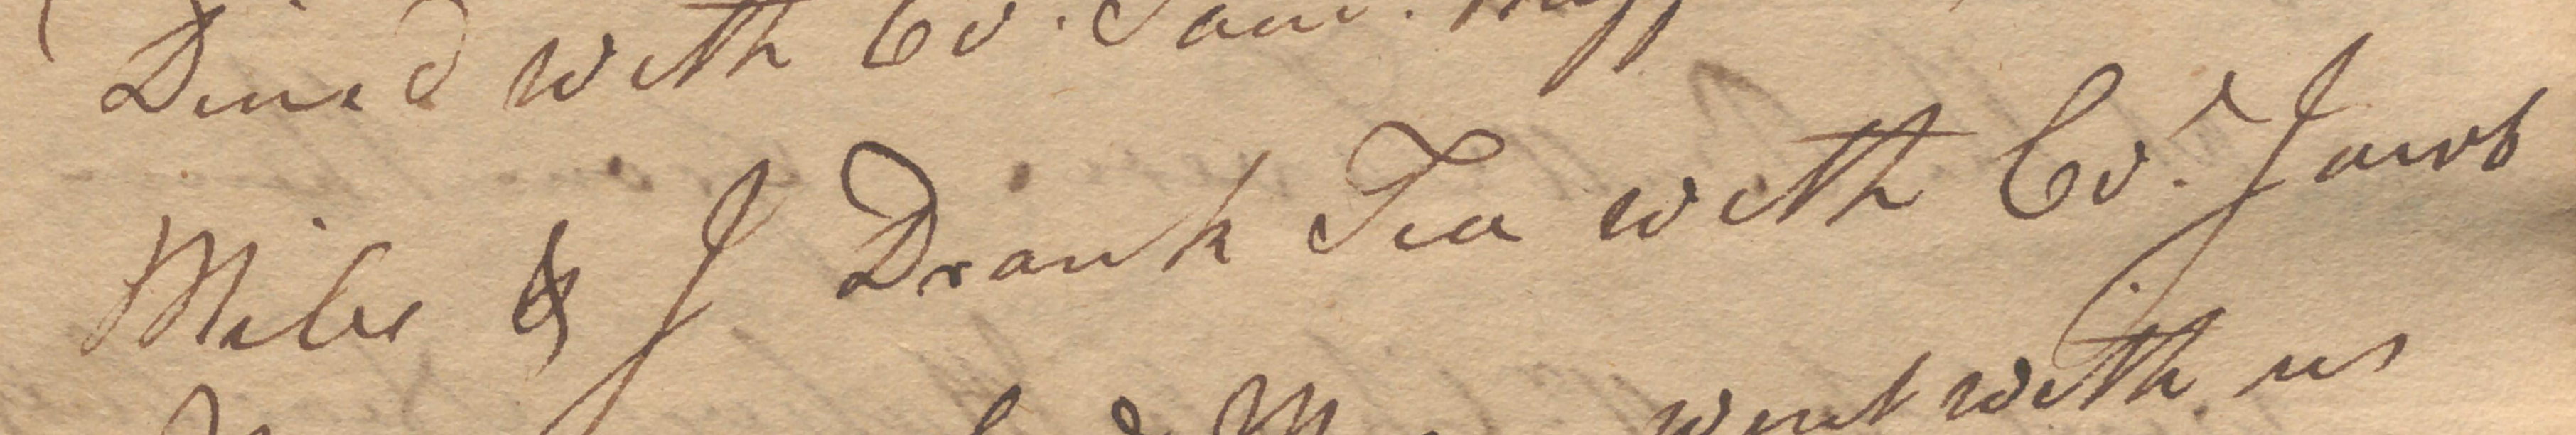Miles & I Drank Tea with Co^r. Jacob
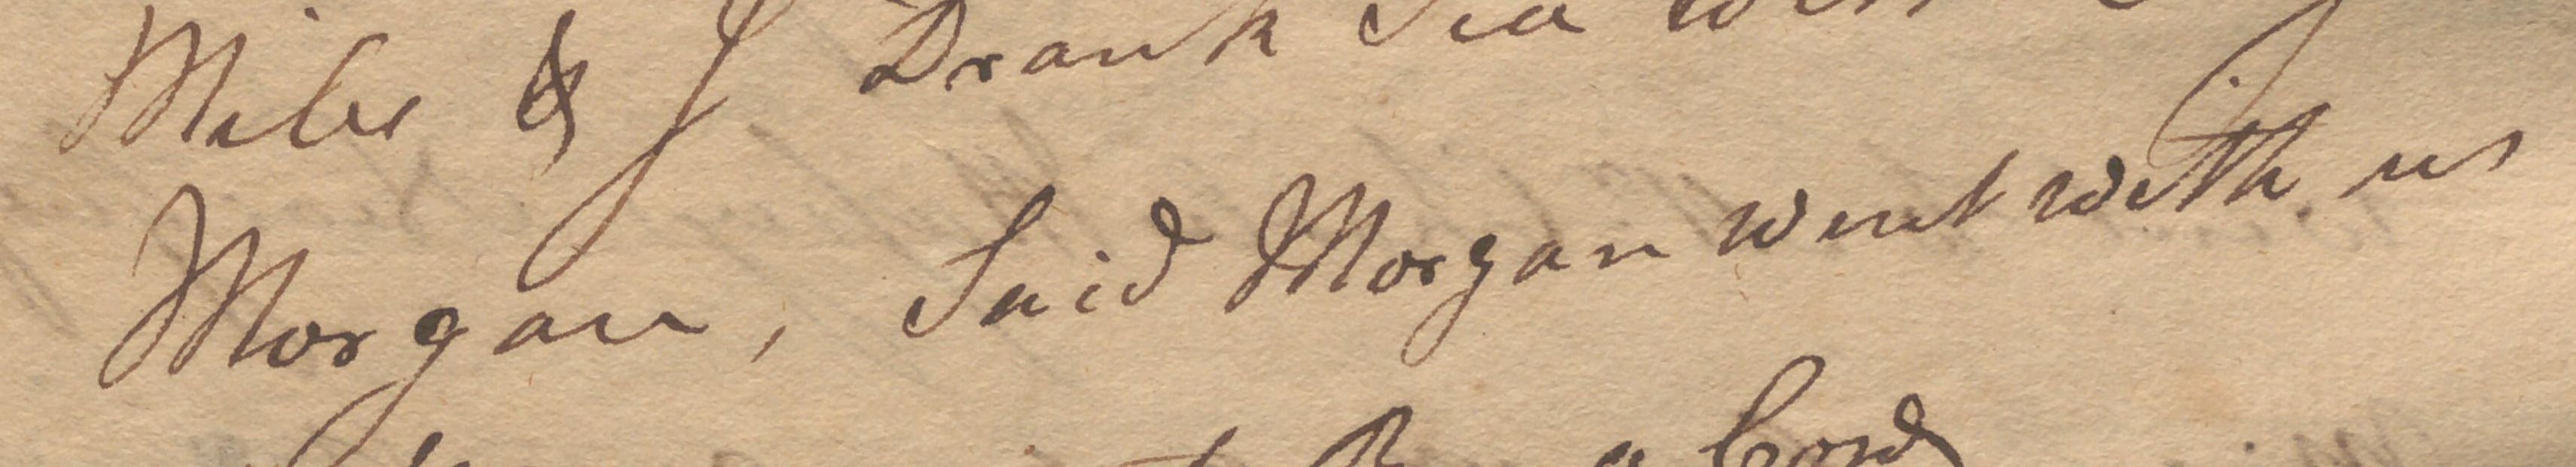Morgan, Said Morgan went with us
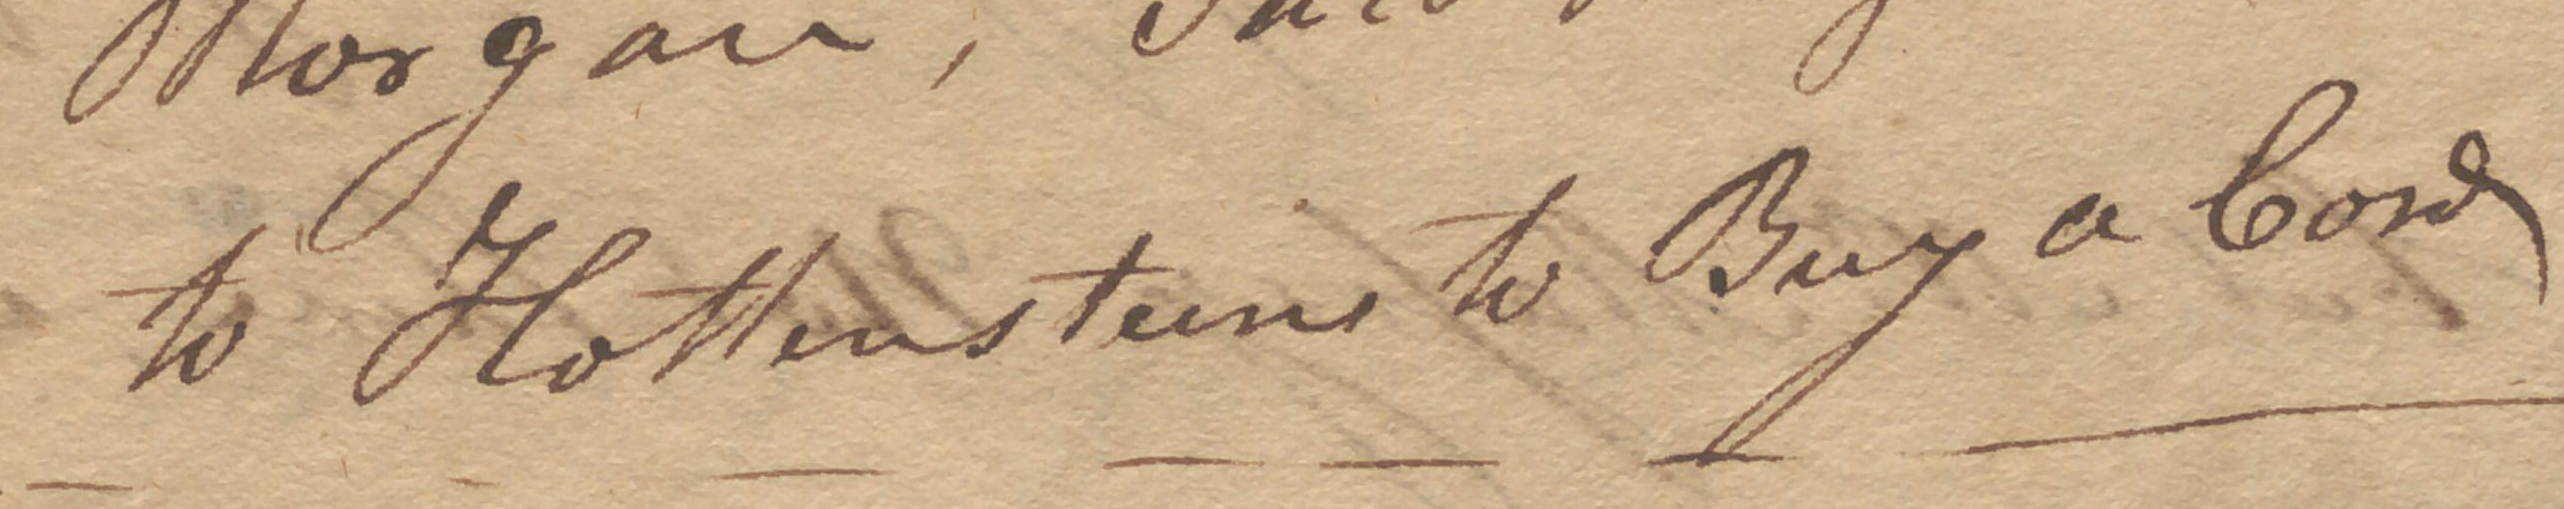to Hottensteins to Buy a Cow.
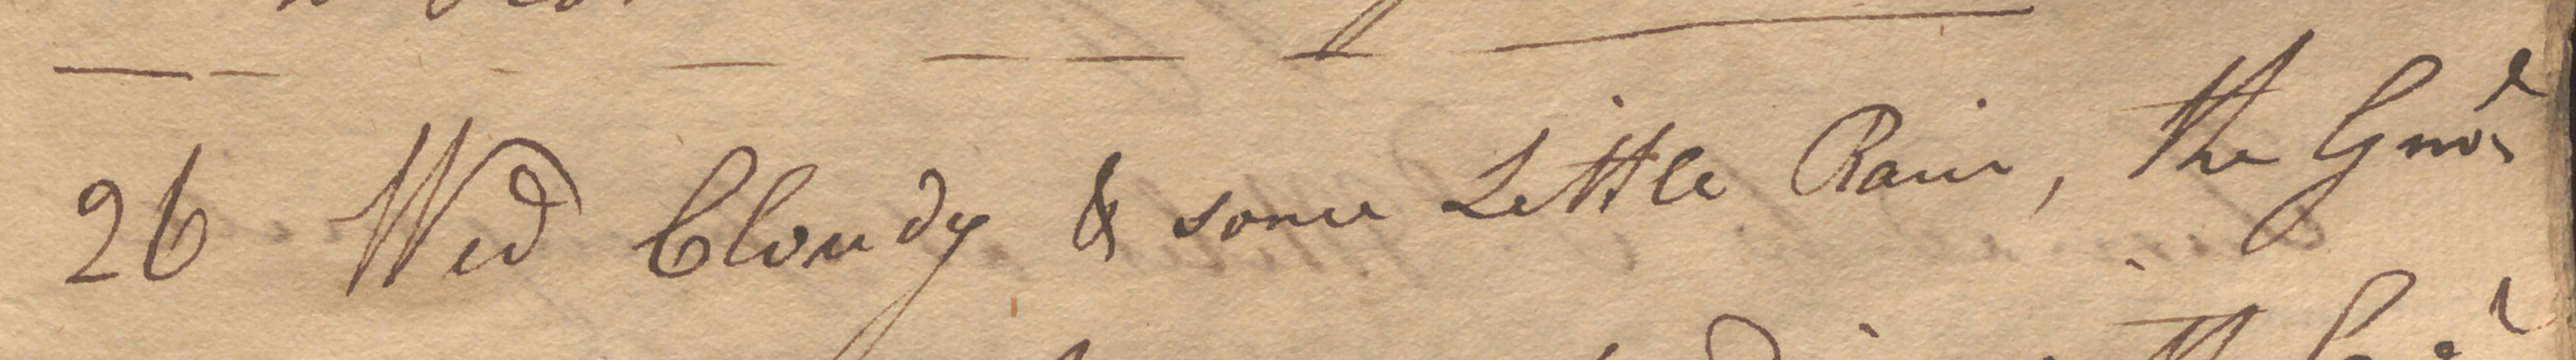26 Wed Cloudy & sone Little Rain, the Gen^l.
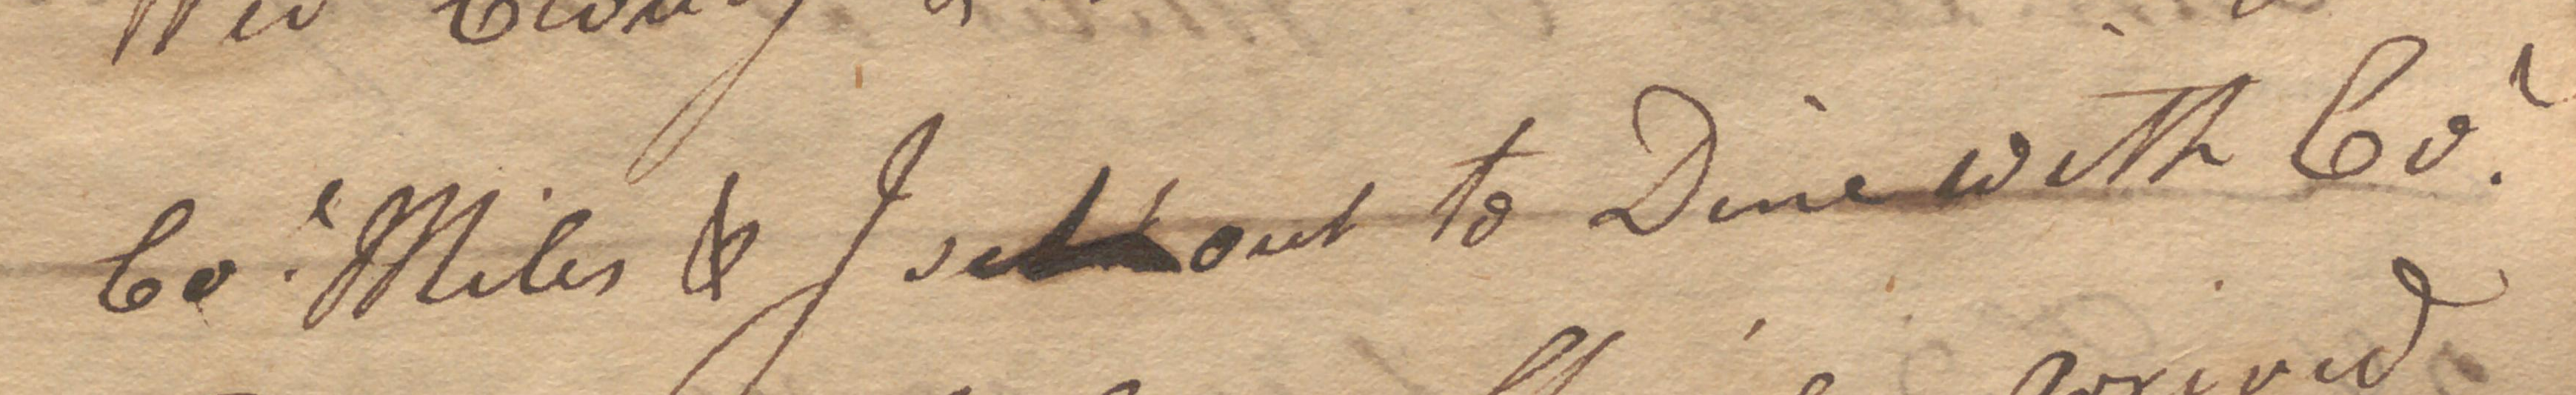Co^l. Miles & I set out to Dine with Ev.
